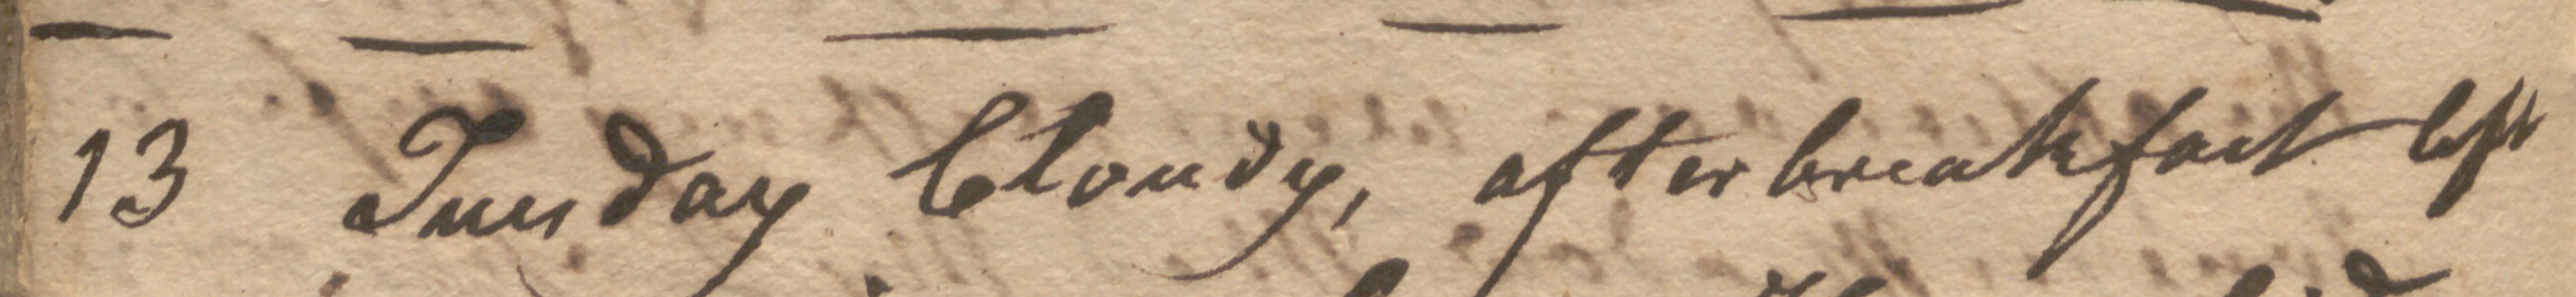13 Tuesday Cloudy, after breakfast left
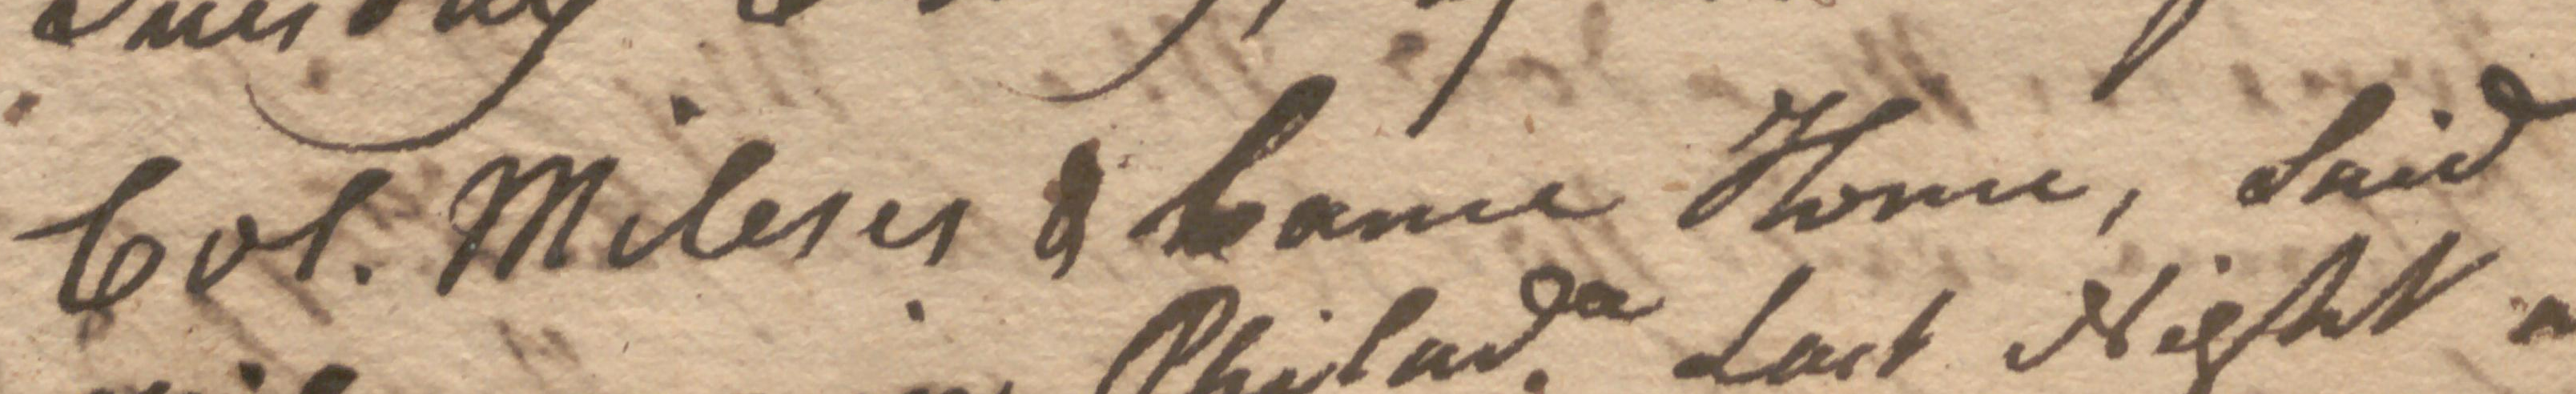Col. Mileses & Came Home, said
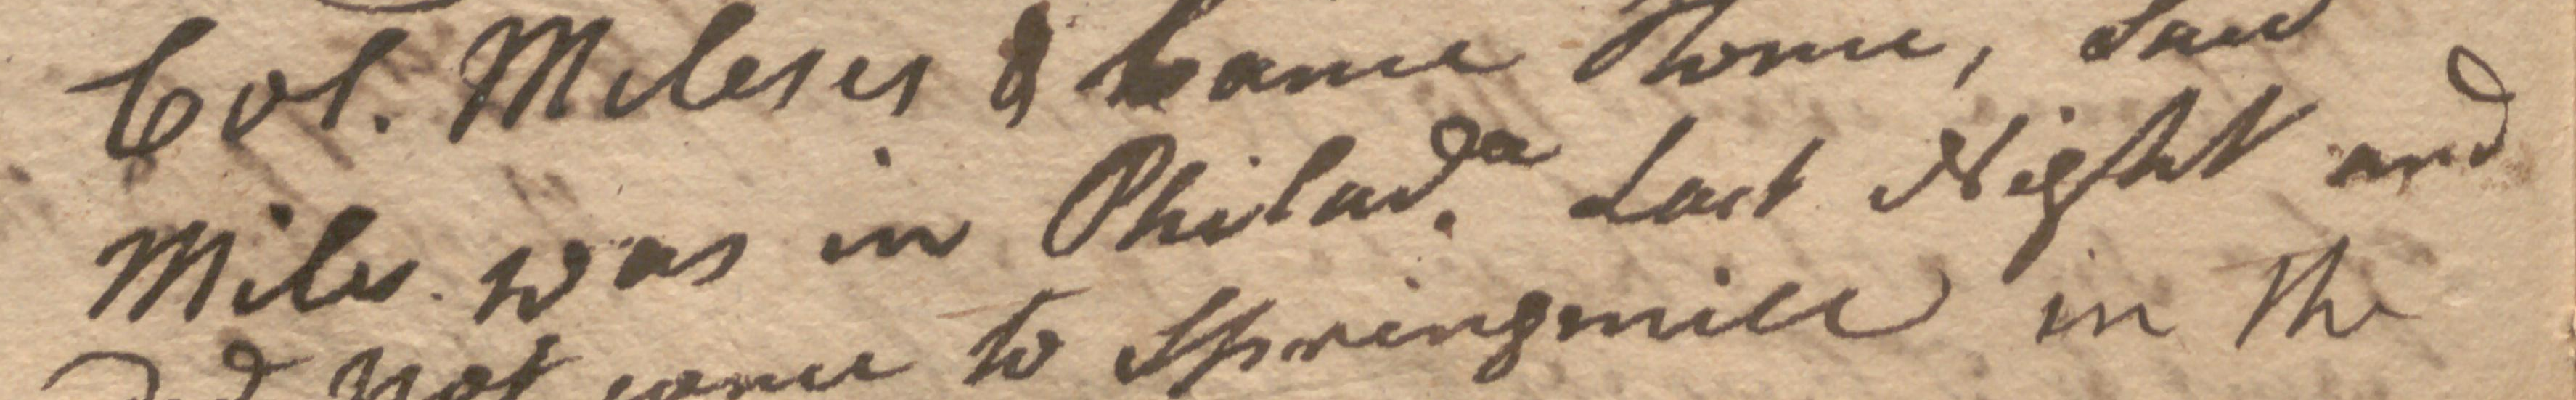Miles was in Philad^a. Last Night and
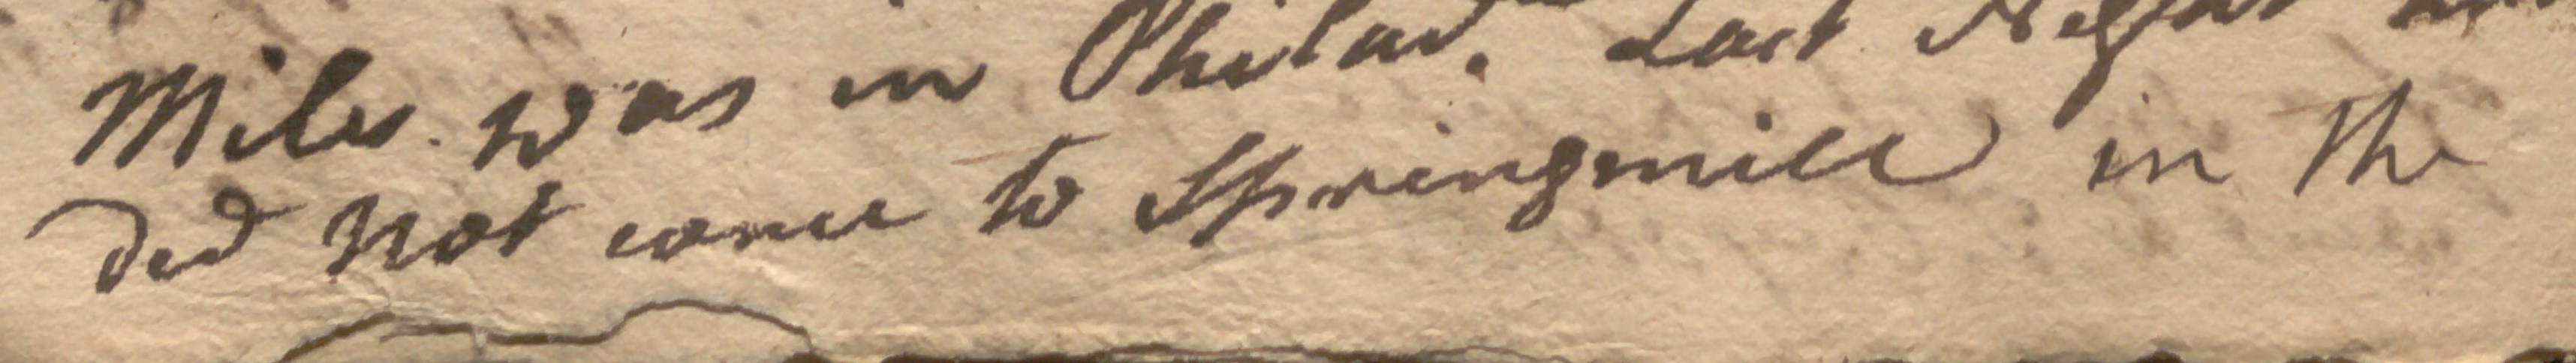did not come to sprringmill in the
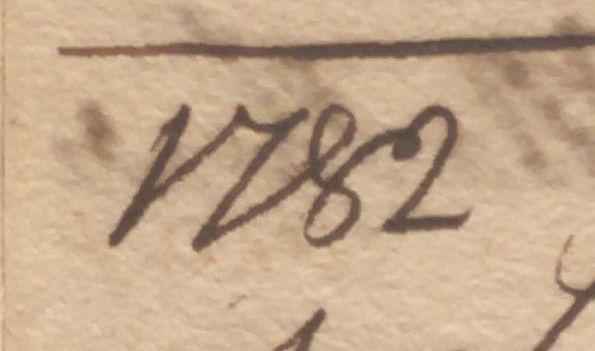1782
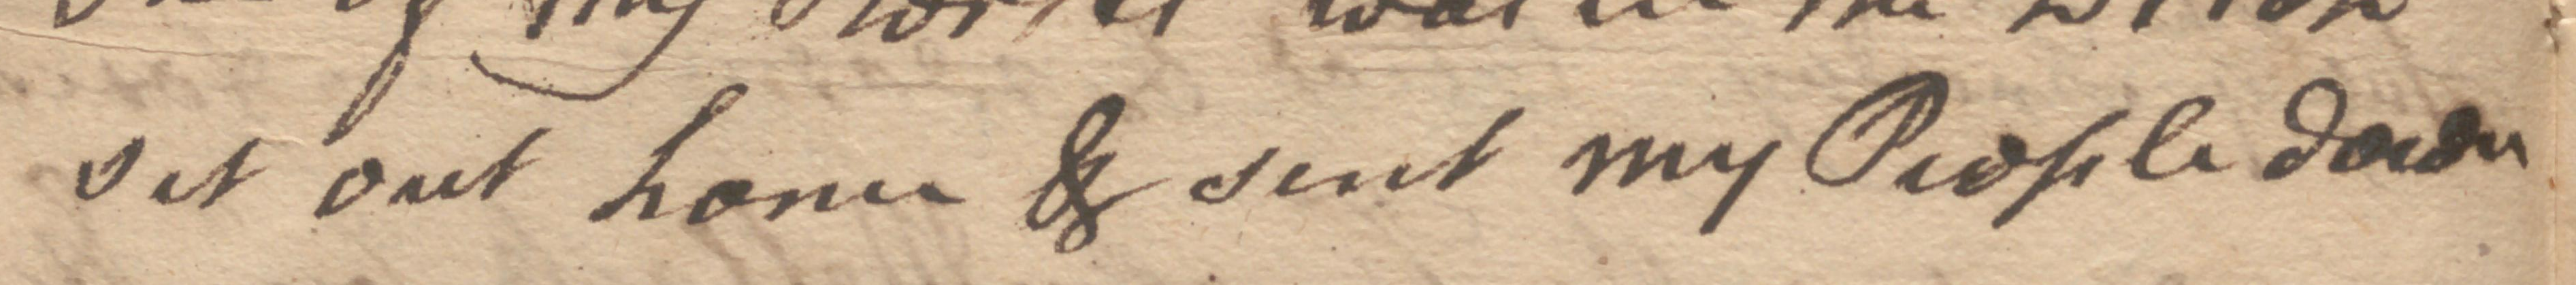set out home & sent my People down
